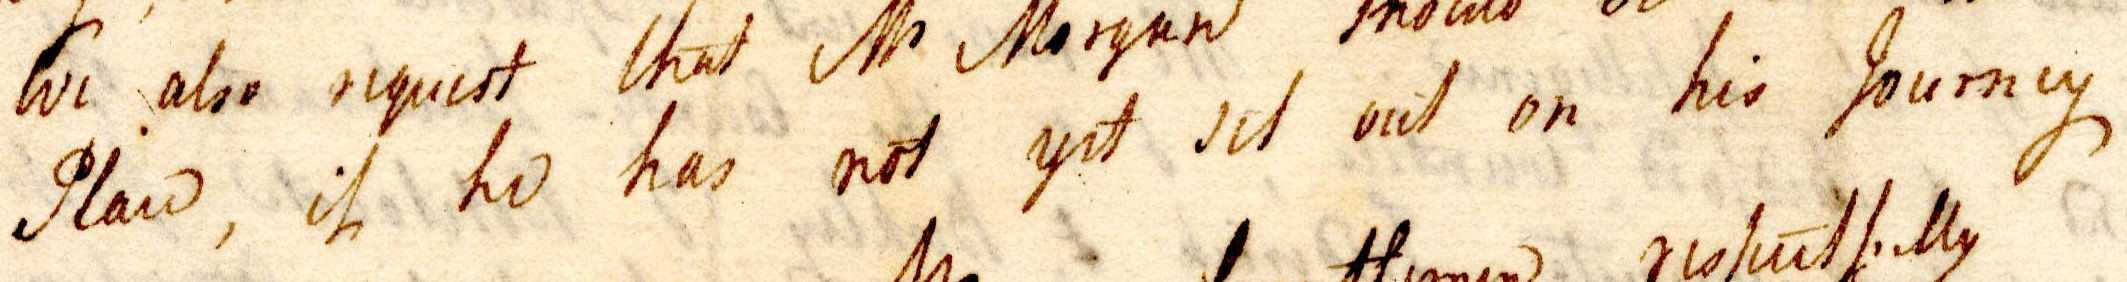Place, if he has not yet set out on his Journey.
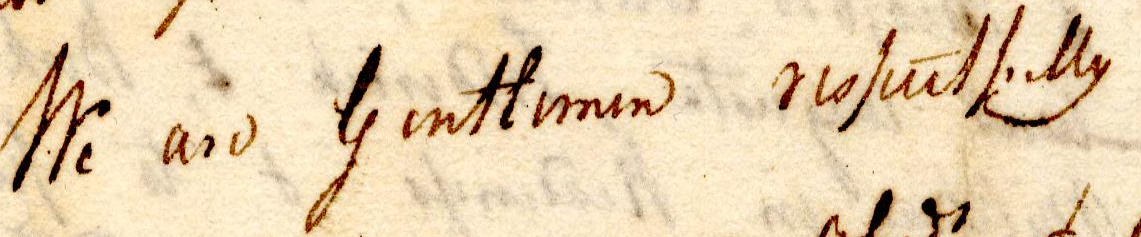We are Gentlemen respectfully
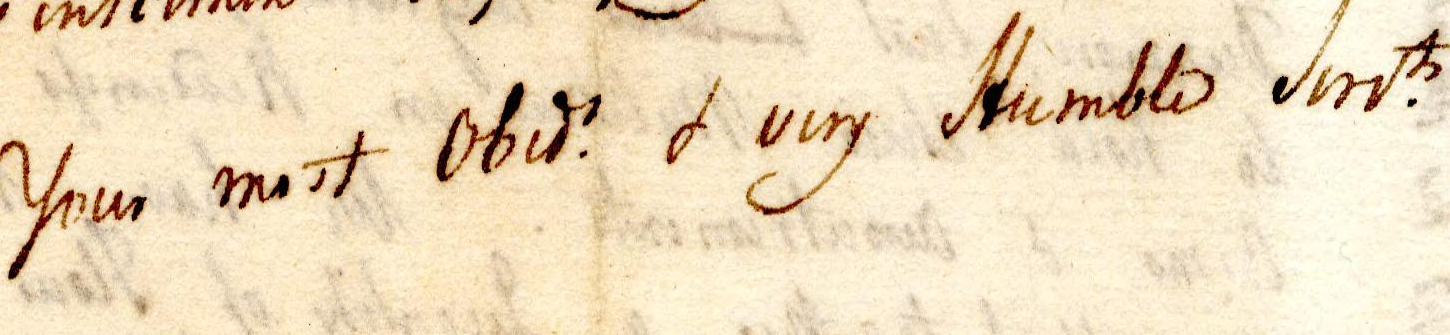Your most Obed^t & very Humble Serv^ts.
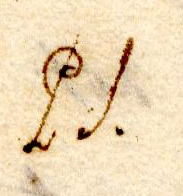PS.
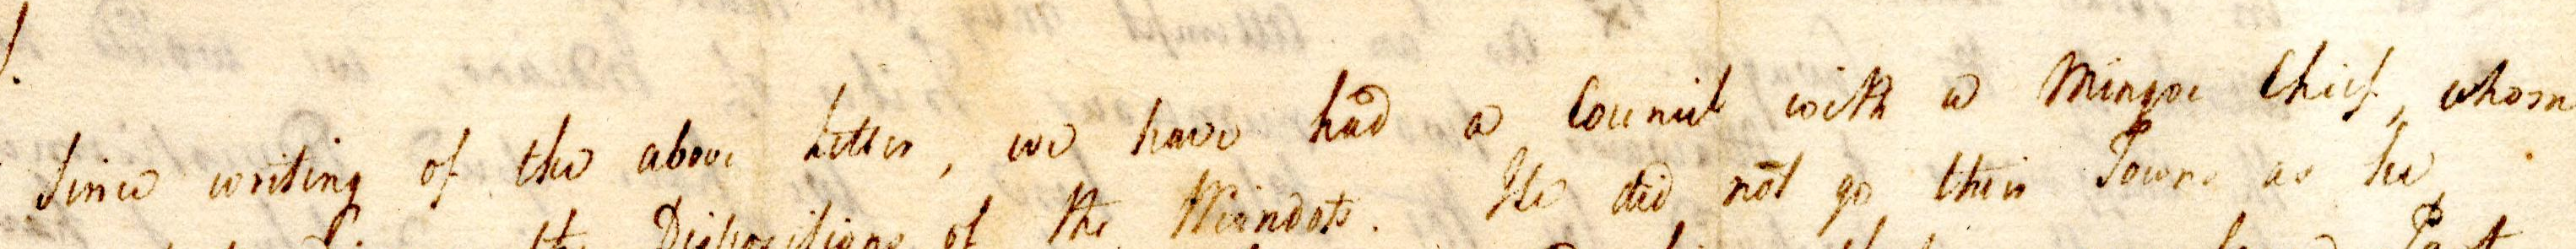Since writing of the above Letter, we have had a Council with a Mingo Chief, whom
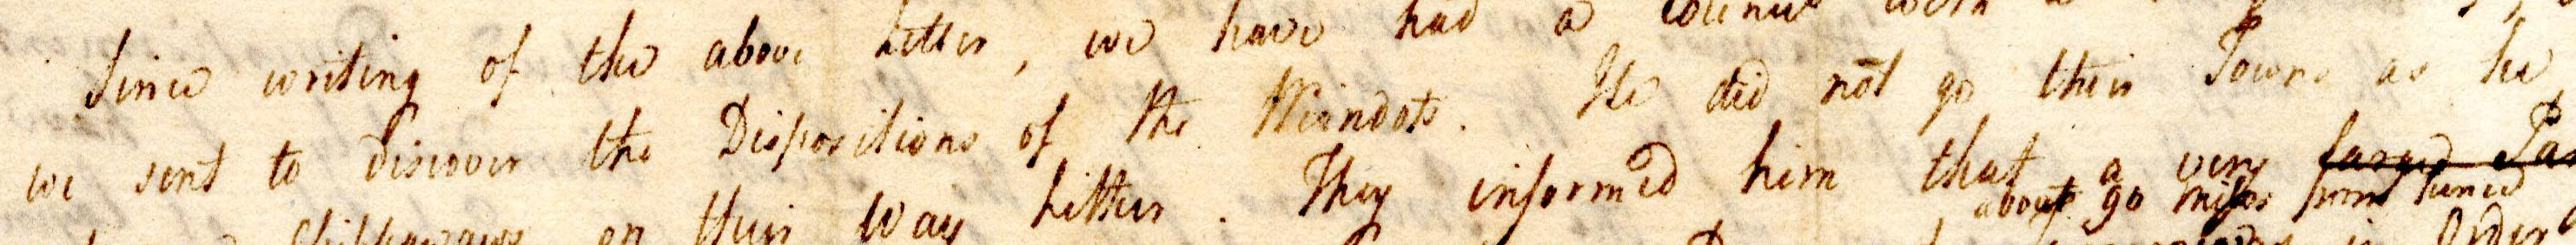we sent to discover the Dispositions of the Wiandots. He did not go then Towne as he
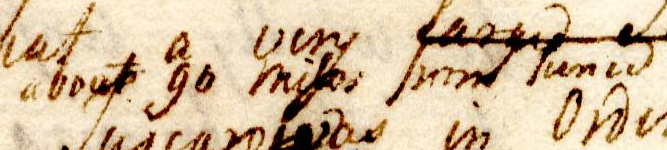about 90 Miles from hence
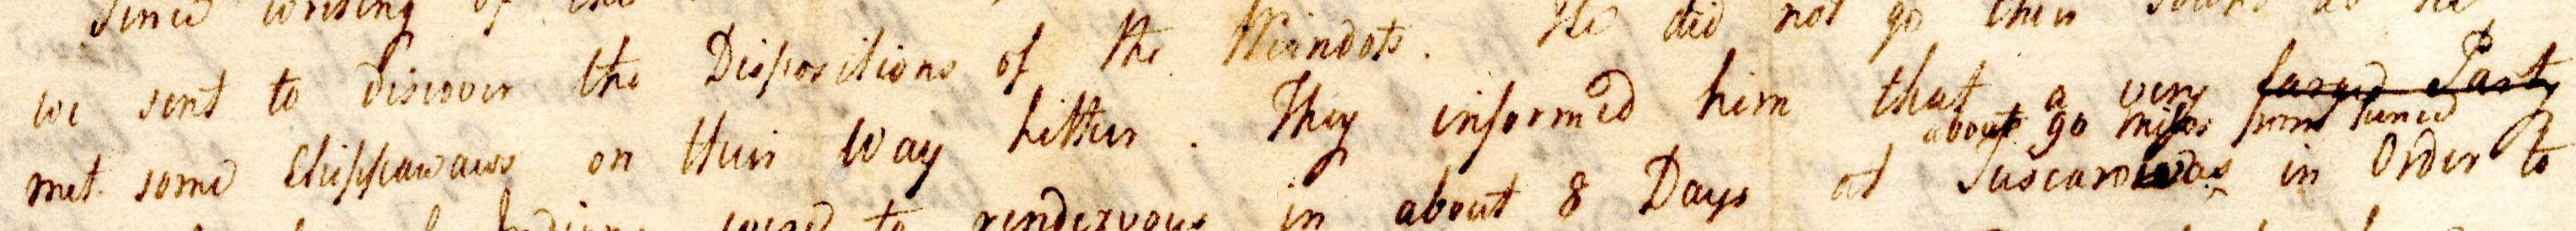met some Chippawaws on their way hither. They informed him that a very large Party
